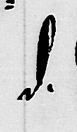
d.
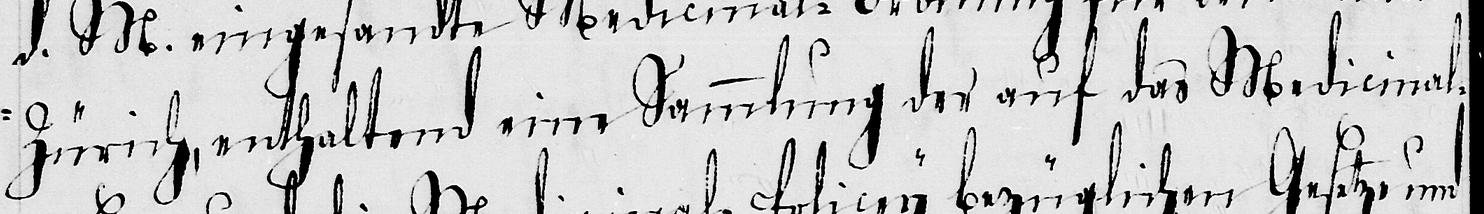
Zürich, enthaltend eine Sammlung der auf das Medicinal¬
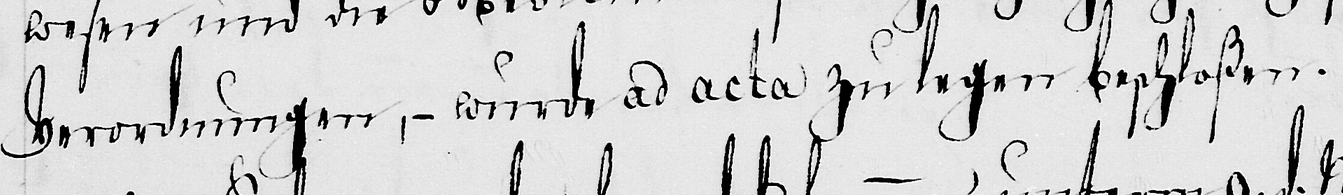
Verordnungen, – wurde ad acta zu legen beschloßen.
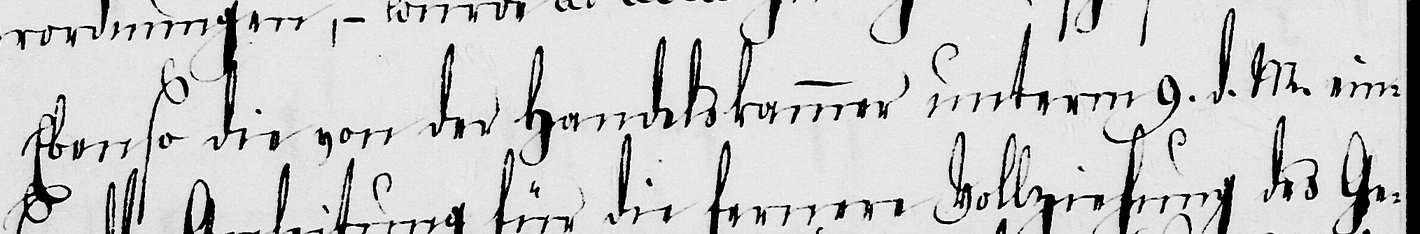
Ebenso die von der Handelskammer unterm 9. d. M. ein¬
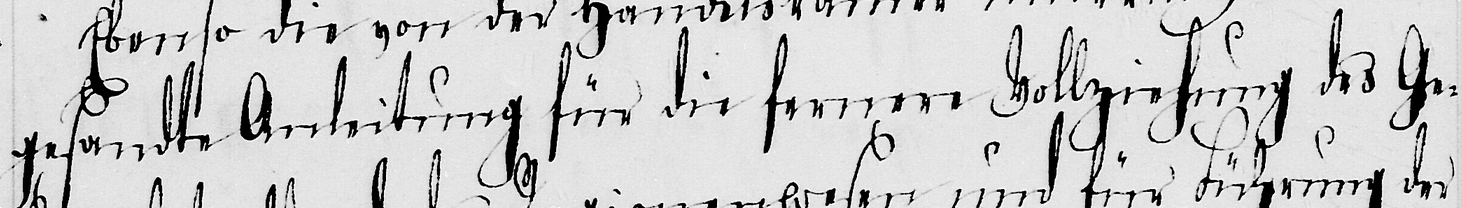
gesandte Anleitung für die fernere Vollziehung des Ge¬
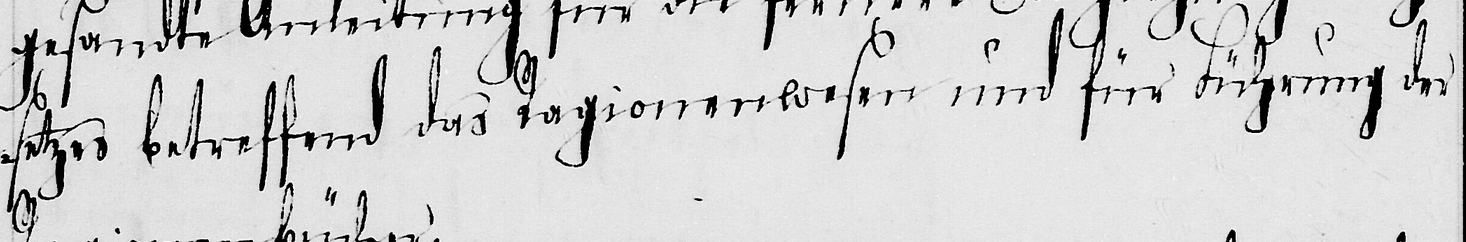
setzes betreffend das Ragionenwesen und für Führung der
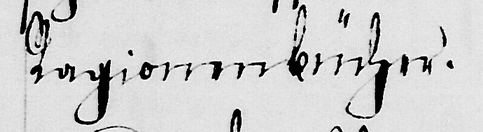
Ragionenbücher.
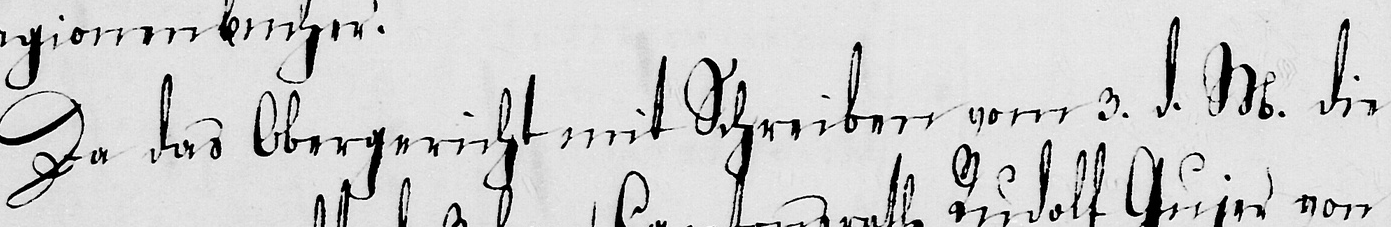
Da das Obergericht mit Schreiben vom 3. d. M. die
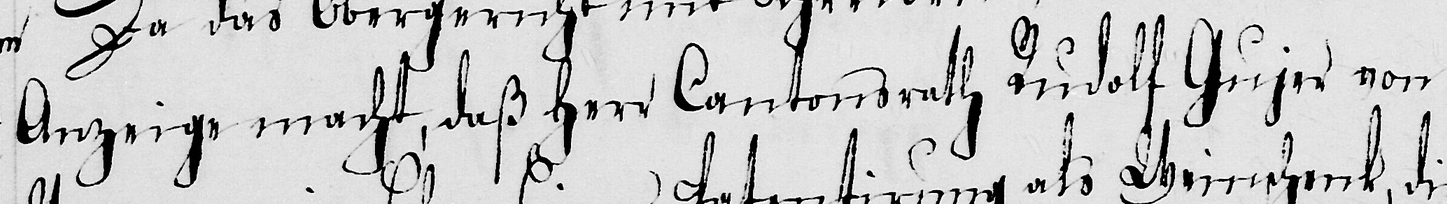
Anzeige macht, daß Herr Cantonsrath Rudolf Gujer von
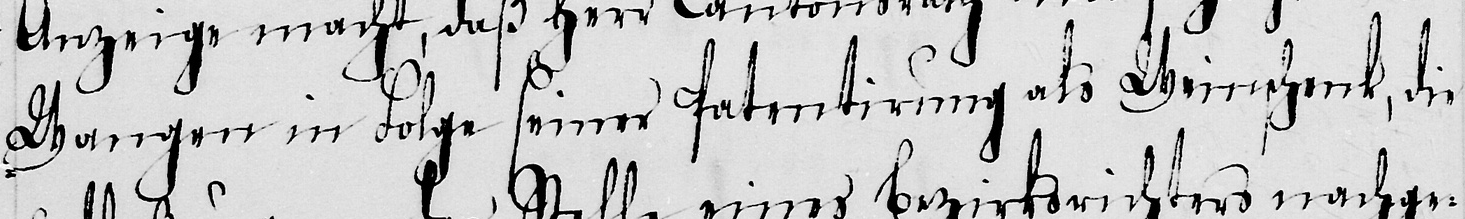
Wangen in Folge seiner Patentirung als Weinschenk, die
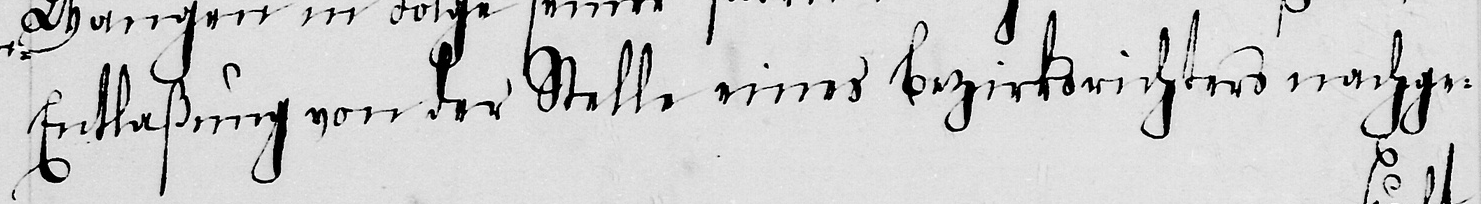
Entlaßung von der Stelle eines Bezirksrichters nachge-
